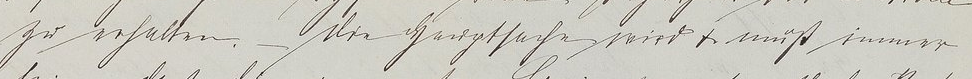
zu erhalten. – Die Hauptsache wird & muß immer
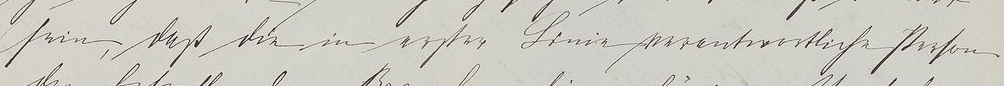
sein, daß die in erster Linie verantwortliche Person
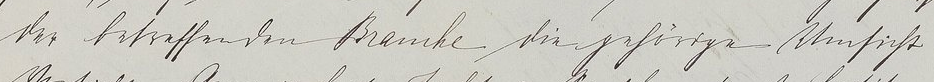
der betreffenden Branche die gehörige Umsicht
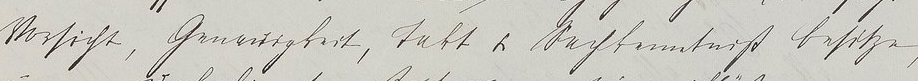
Vorsicht, Genauigkeit, Takt & Sachkenntniß besitze,
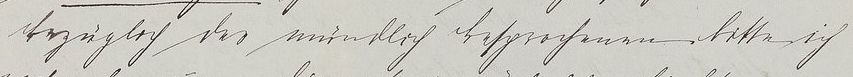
Bezüglich des mündlich Besprochenen bitte ich
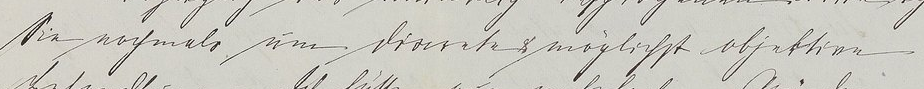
Sie nochmals um discrete & möglichst objektive
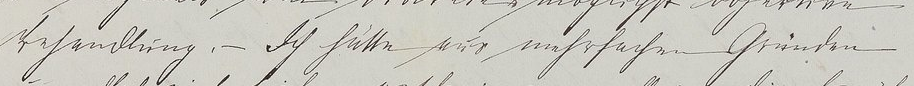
Behandlung. – Ich hätte aus mehrfachen Gründen
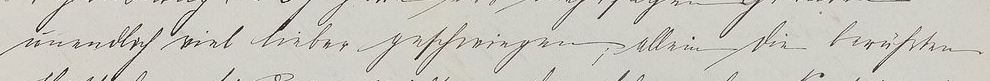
unendlich viel lieber geschwiegen; allein die berührten
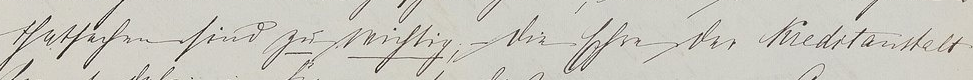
Thatsachen sind zuwichtig; – die Ehre der Kreditanstalt
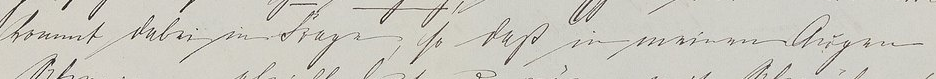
kommt dabei in Frage, so daß in meinen Augen
